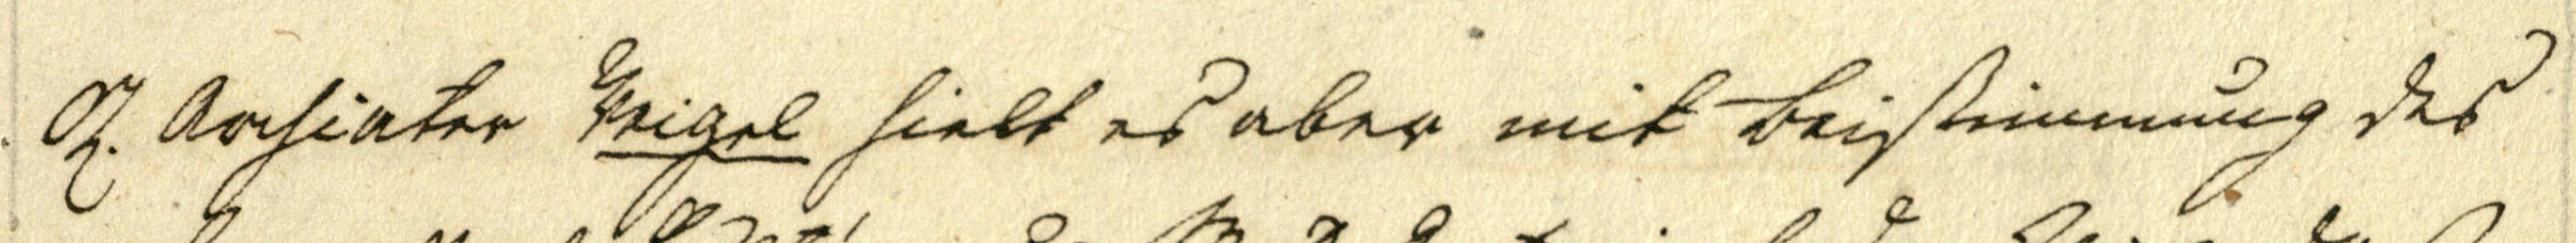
dh. Archiater Weigel hielt es aber mit Beistimmung des
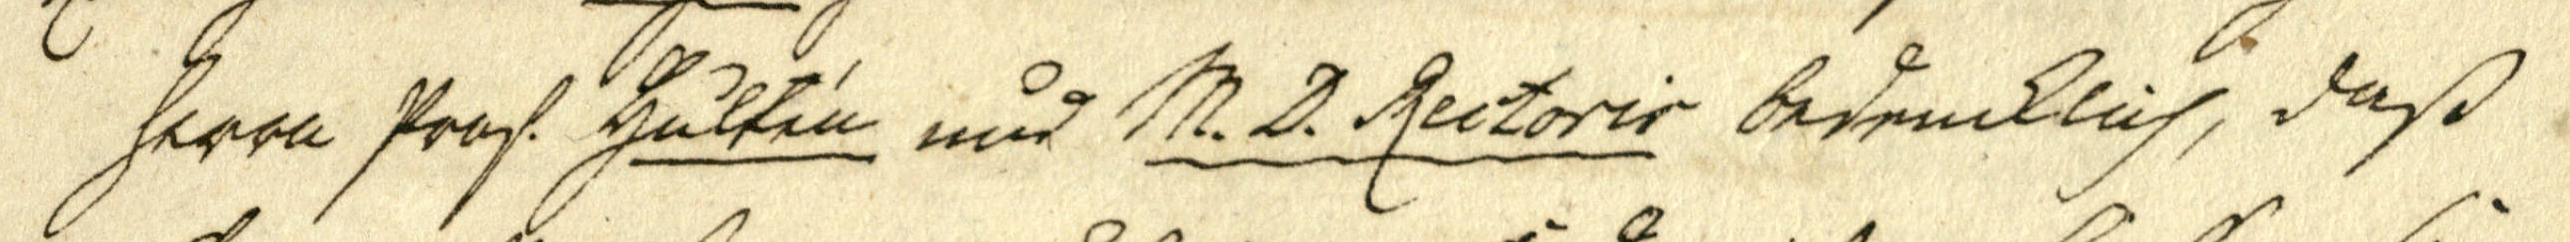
herrn Prof. Hultèn und M. D. Rectoris bedencklich, daß
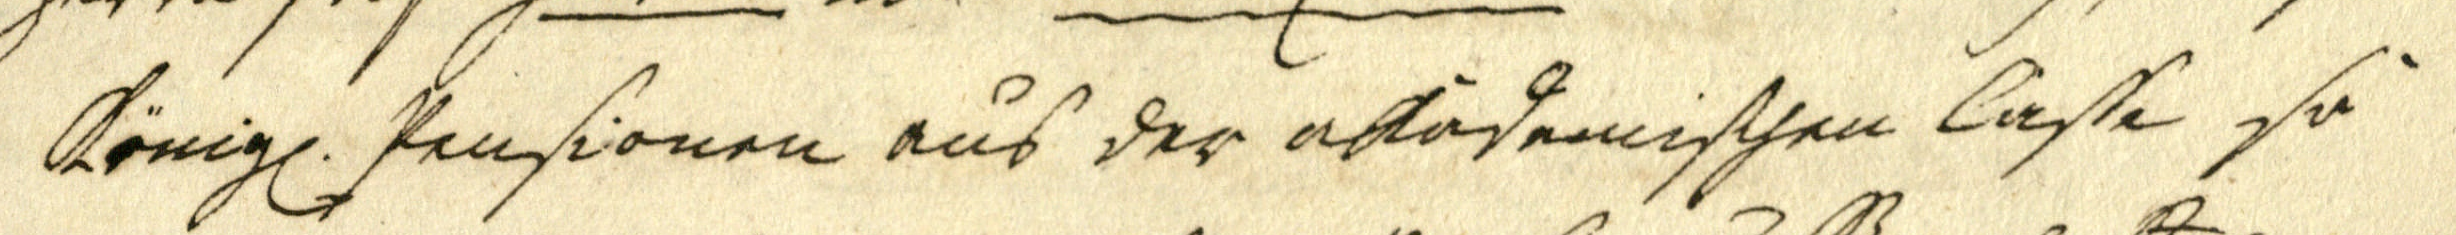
Königl. Pensionen aus der akademischen Casse so
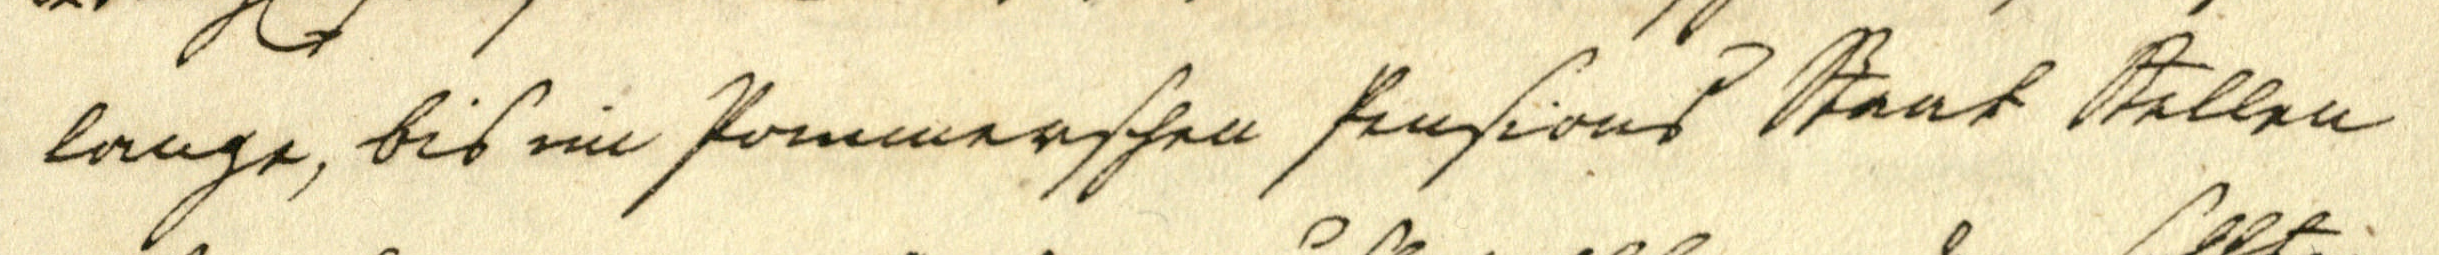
lange, bis im Pommerschen Pensions Staat Stellen
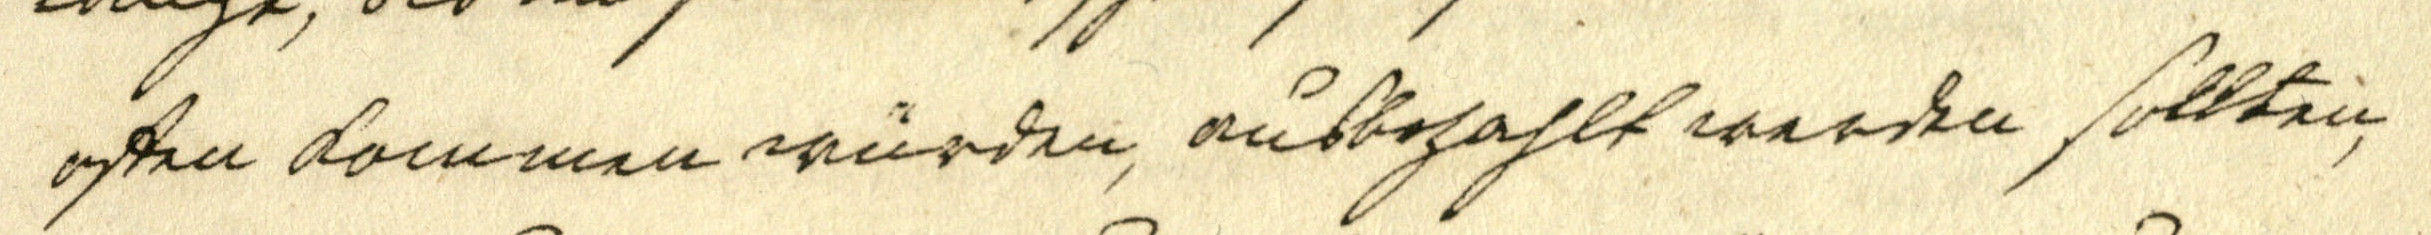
ofen kommen würden, ausbezahlt werden sollten,
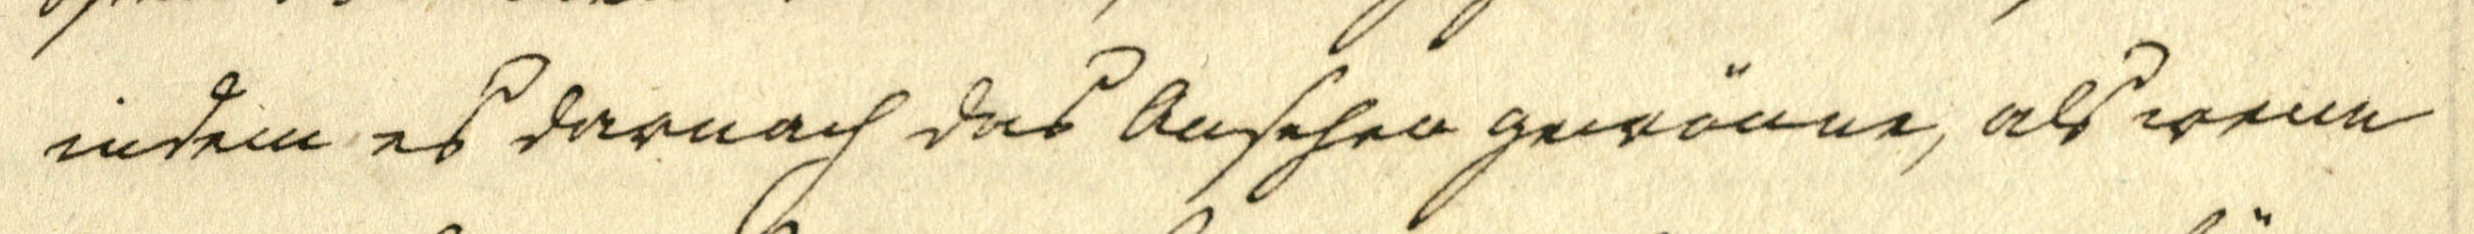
indem es darnach das Ansehen gewönne, als wenn
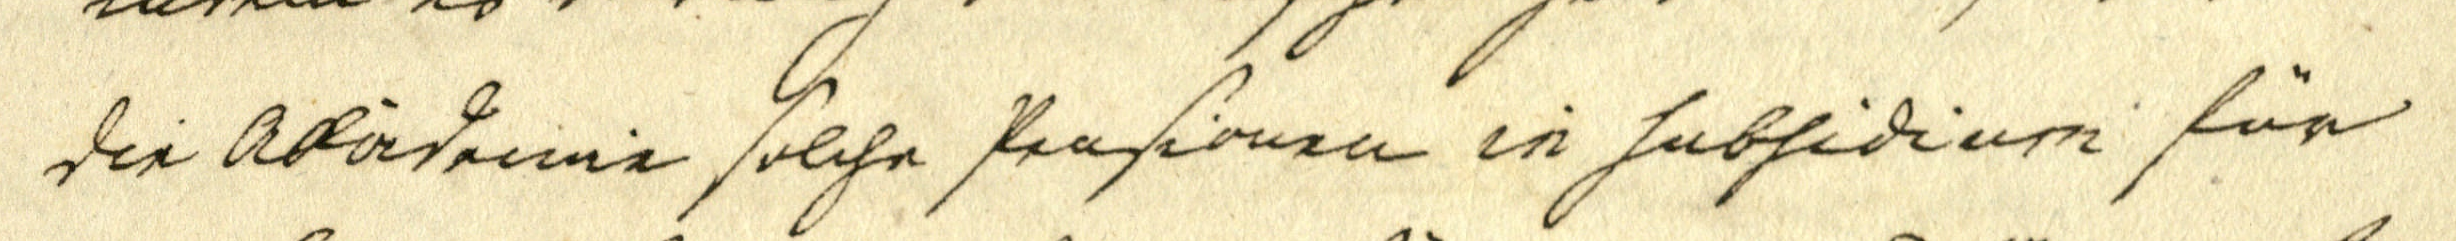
die Akademie solche Pensionen in subsidium für
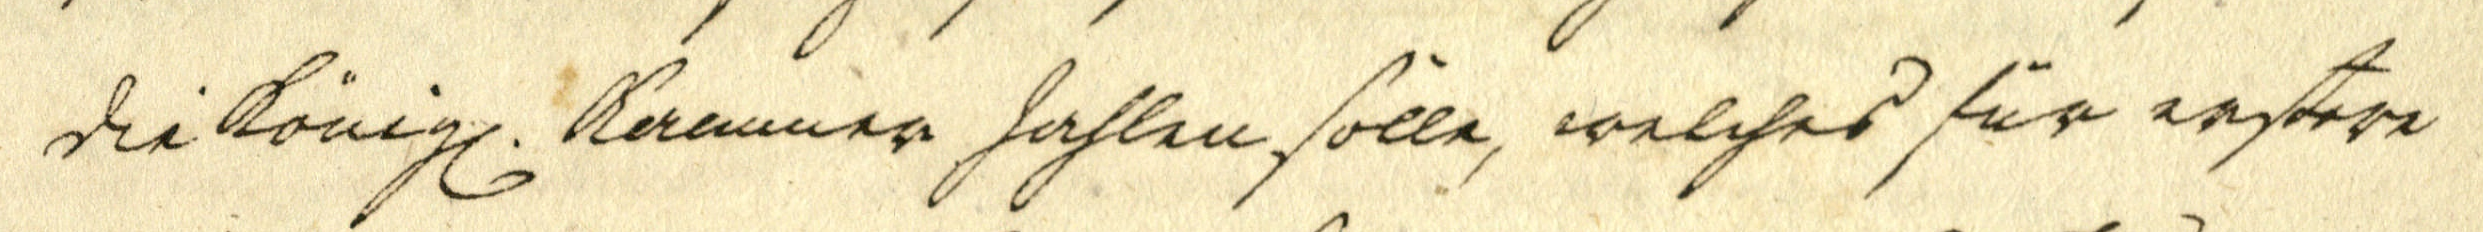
die Königl. Kammer zahlen solle, welches für erstere
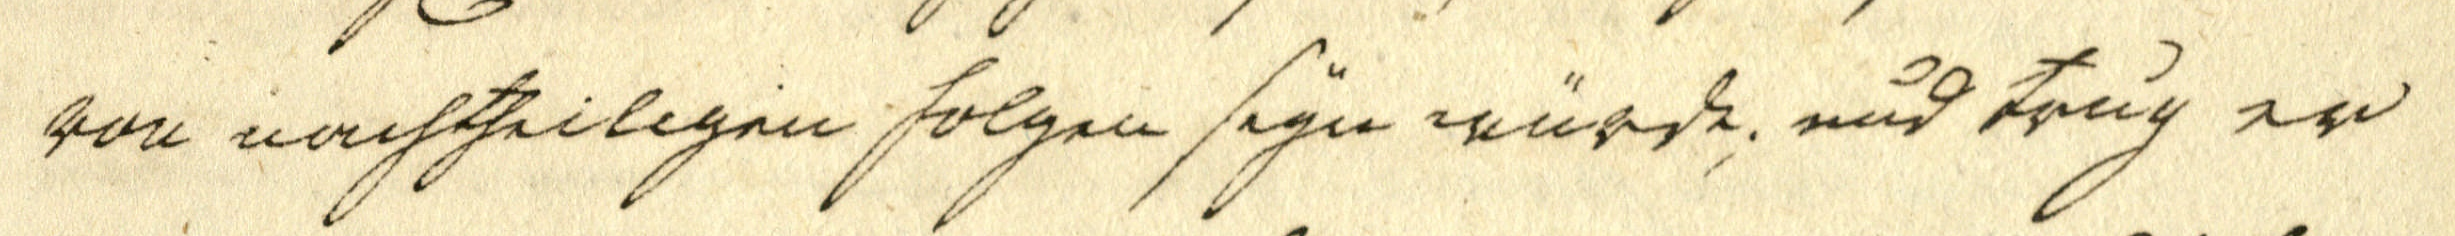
von nachtheiligen Folgen seÿn würde; und trug er
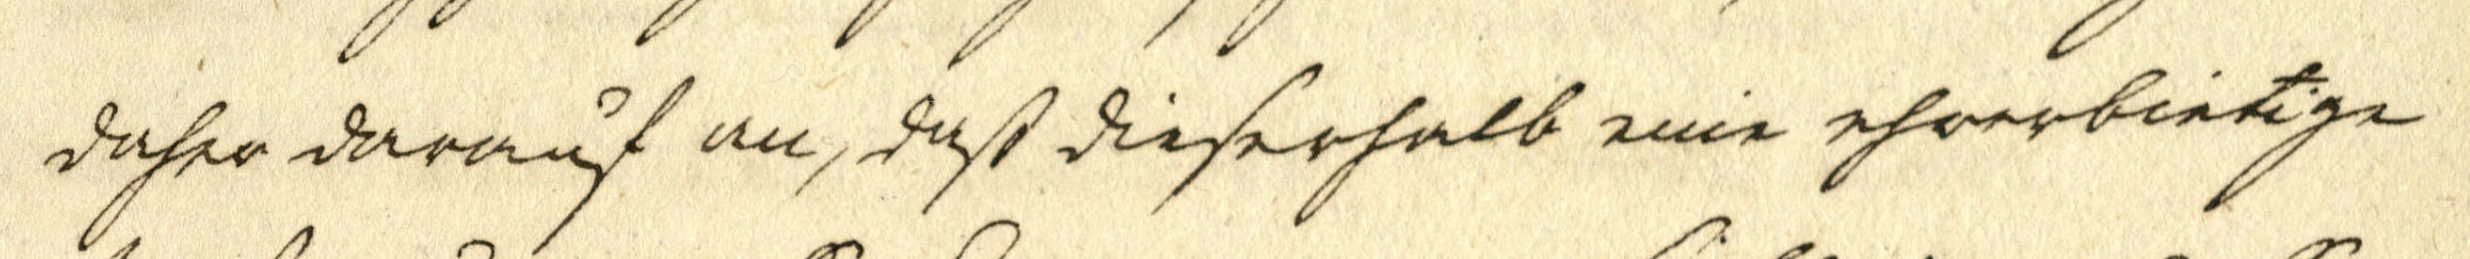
daher darauf an, daß dieserhalb eine ehrerbietige
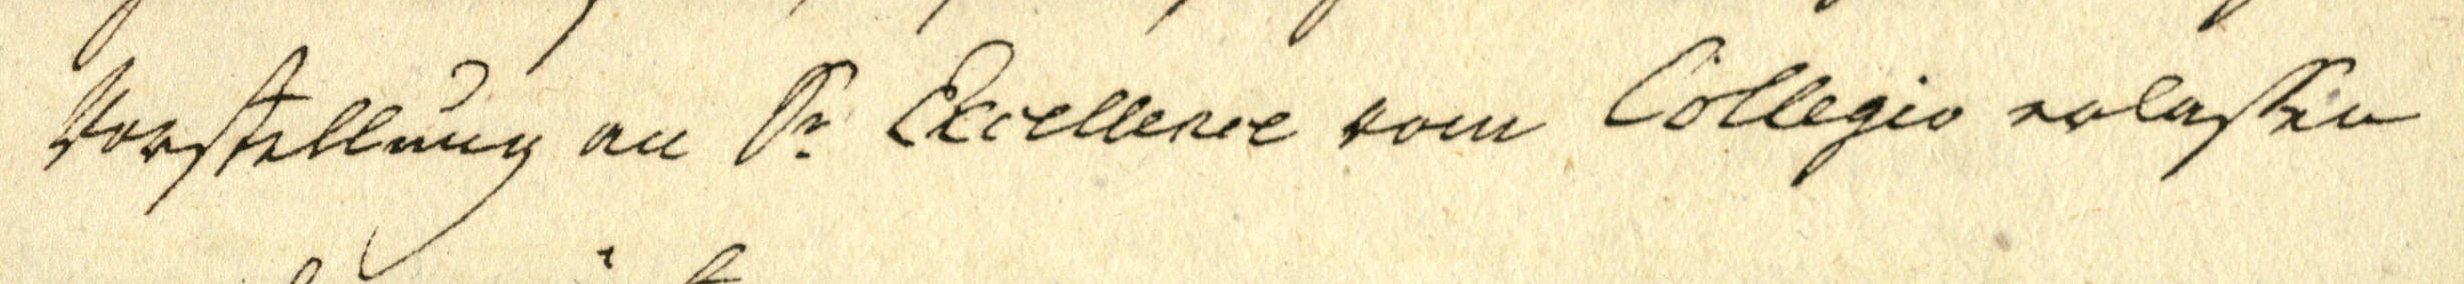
Vorstellung an Sr. Excellence vom Collegio erlassen
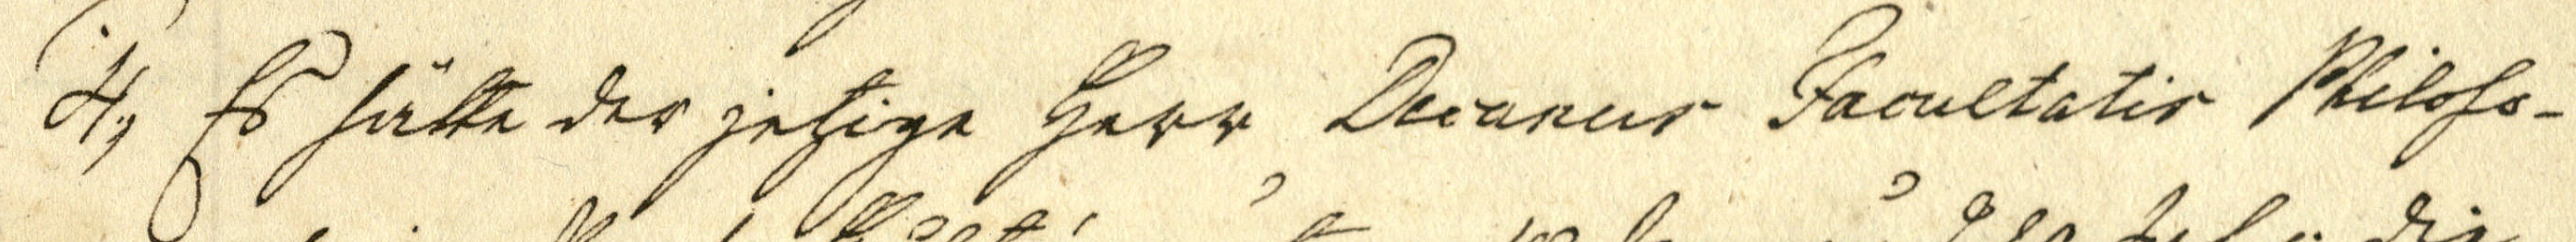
4., Es hätte der jetzige Herr Decanus Facultatis Philoso¬
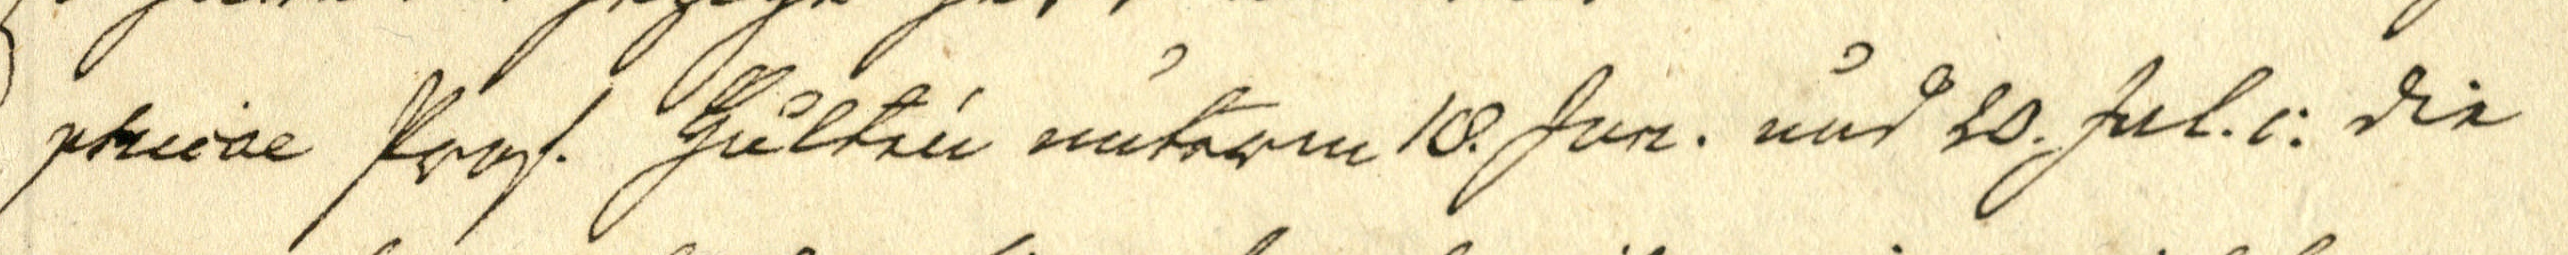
phicae Prof. Hultèn unterm 18. Jun. und 20. Jul. c. die
